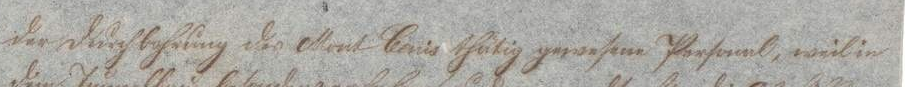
der Durchbohrung des Mont Cenis thätig gewesene Personal, weil in
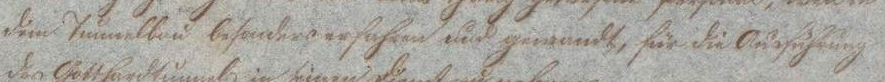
dem Tunnelbau besonders erfahren und gewandt, für die Ausführung
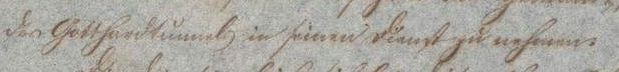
des Gotthardtunnels in seinen Dienst zu nehmen.
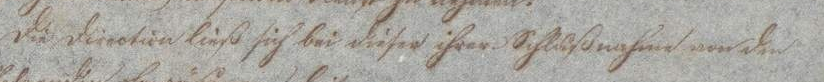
Die Direction ließ sich bei dieser ihrer Schlußnahme von den
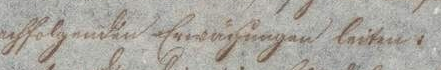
nachfolgenden Erwägungen leiten:
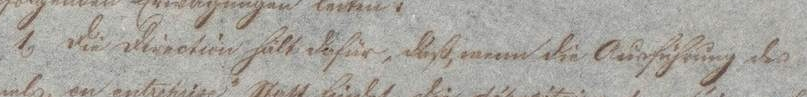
1. die Direction hält dafür, daß, wenn die Ausführung des
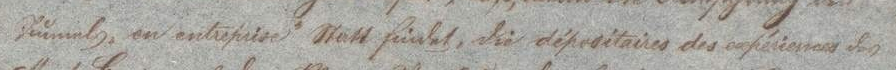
Tunnels «en entreprise» Statt findet, die dépositaires des expériences des
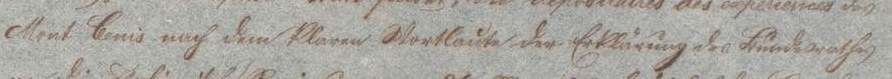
Mont Cenis nach dem klaren Wortlaute der Erklärung des Bundesrathes
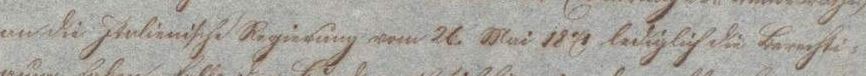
an die Italienische Regierung vom 26. Mai 1871 lediglich die Berechti-
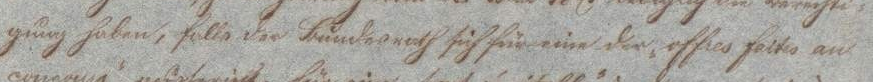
gung haben, falls der Bundesrath sich für eine der «offres faites au
